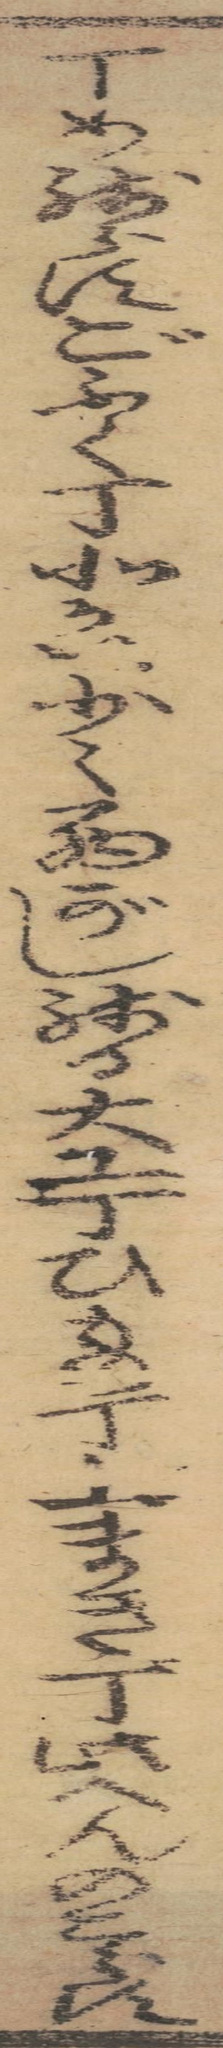丁め残らすごふく丁北かは少〻西がし残る大工丁ひもの丁上まき丁此へんのこらす
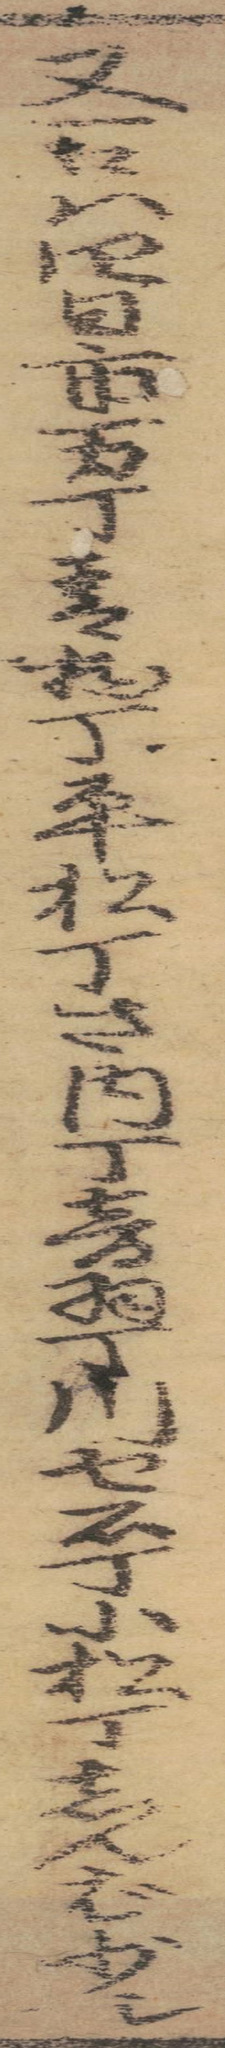又一口は四日市万丁青物丁平松丁さ内丁音羽丁川セ石丁小松丁しんば少シ
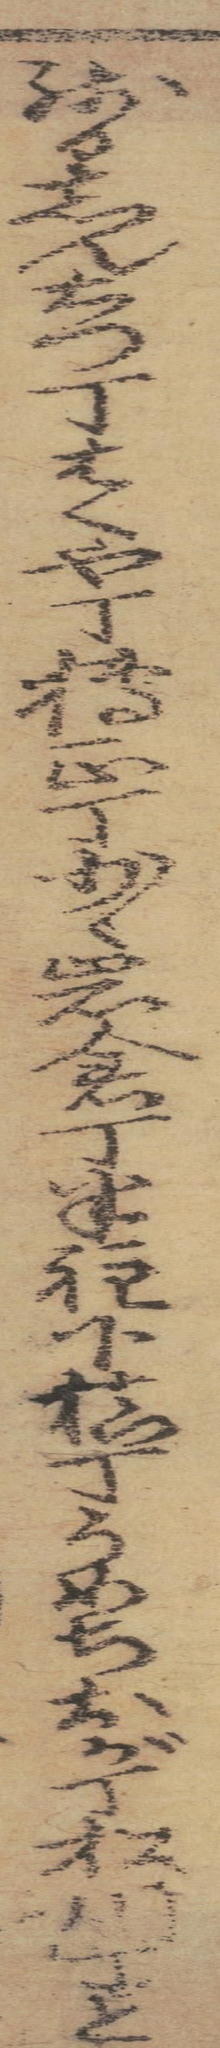残るしん右衛門丁はくや丁搏正丁少く岩倉丁半程下槙丁うめちおが丁松川丁と
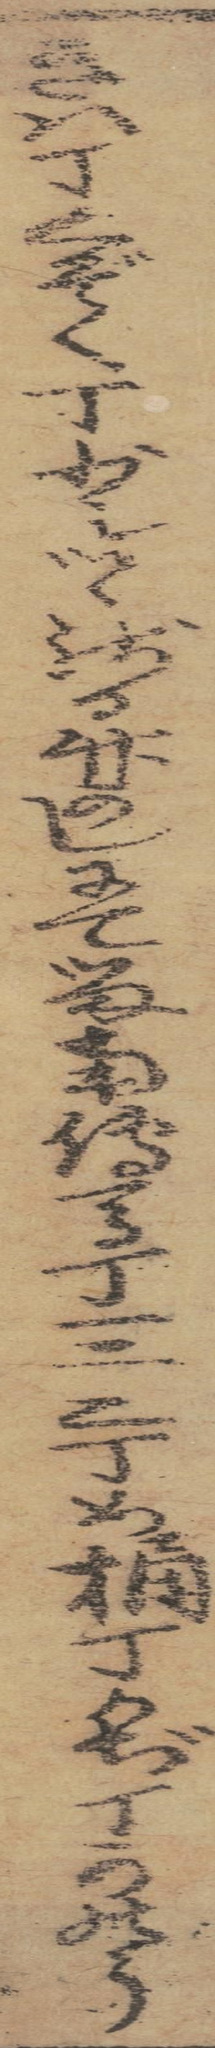きは丁くぞく丁少シツヽ残る竹かしにて留南傳馬丁一二三丁め桶丁かぢ丁かのう
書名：[安政五年十一月の江戸大火に関する瓦版]
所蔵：東京大学地震研究所図書室 Earthquake Research Institute Library, The University of Tokyo, JAPAN
